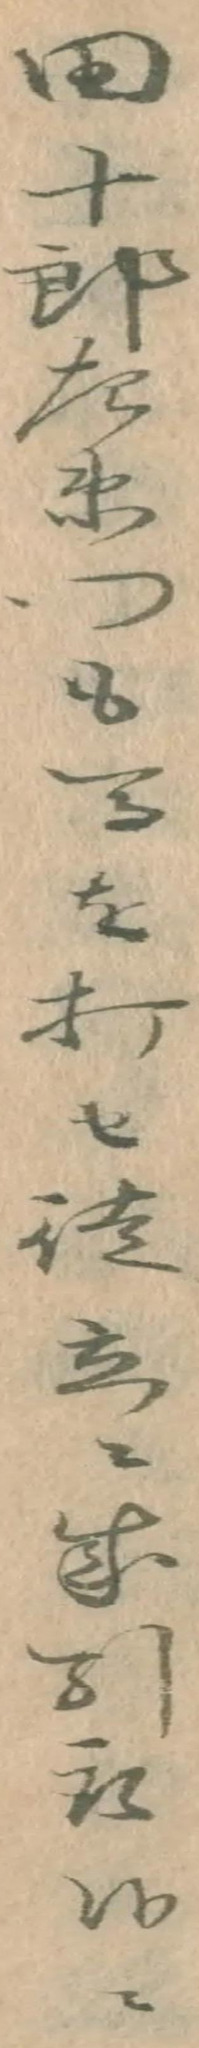田十郎左衛門も馬を打せ徒立に成引取候に

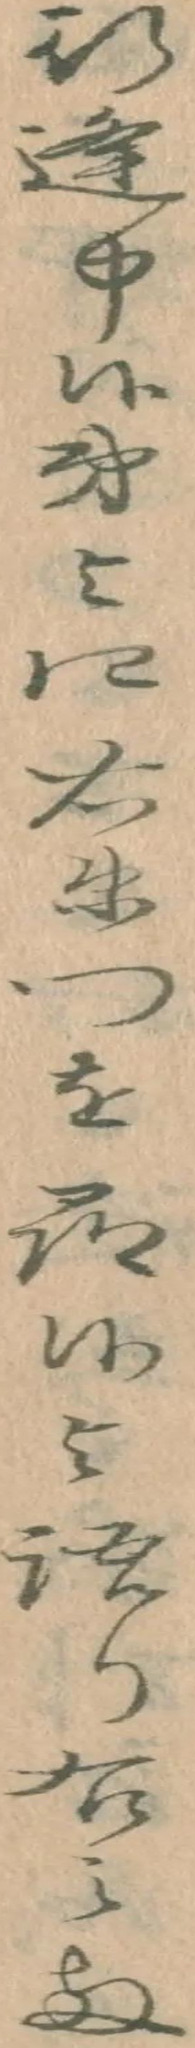行逢申候弟与四右衛門を尋候与語り右之両
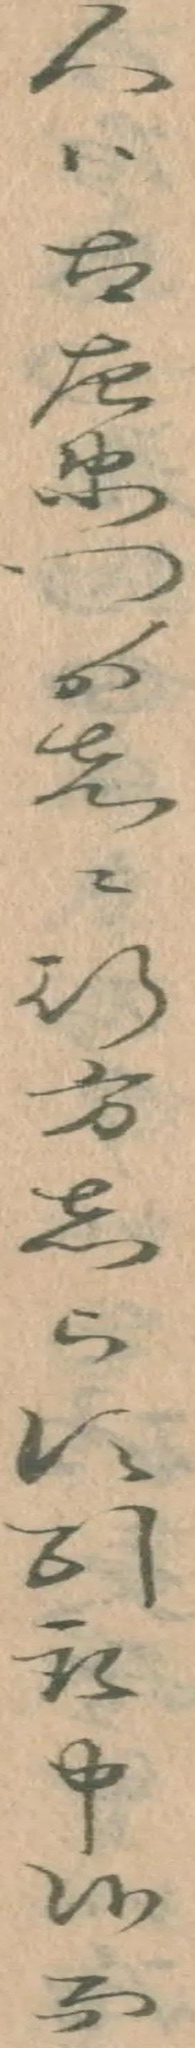人は太左衛門ゟ先に行方志ら須引取申候而
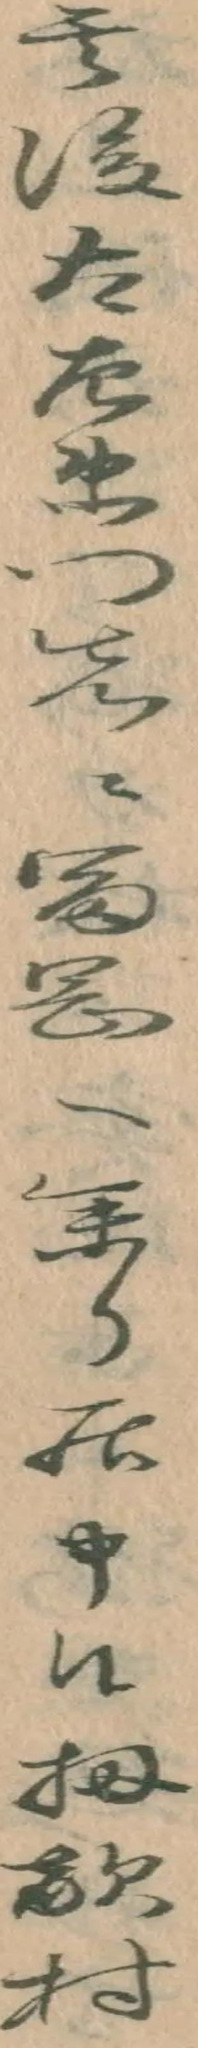其後太左衛門先に冨岡へ参り居申候扨敵村
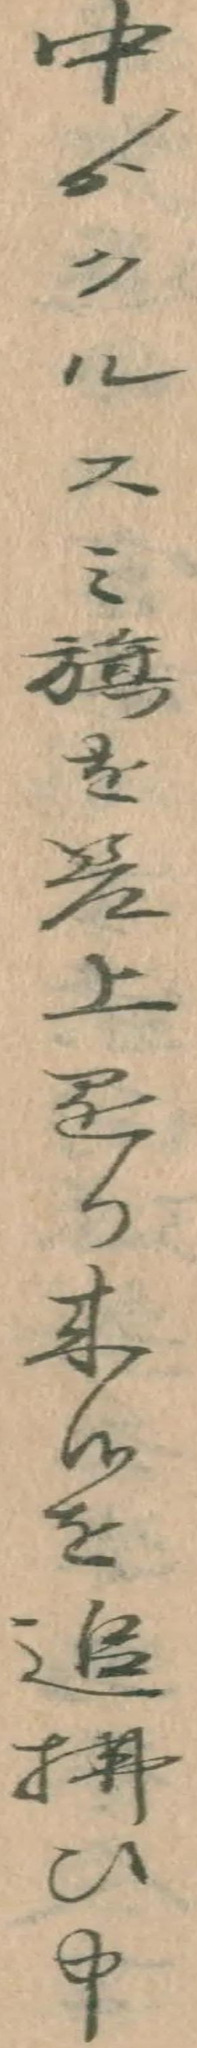中ゟクルスみ旗を差上懸り来候を追払ひ申
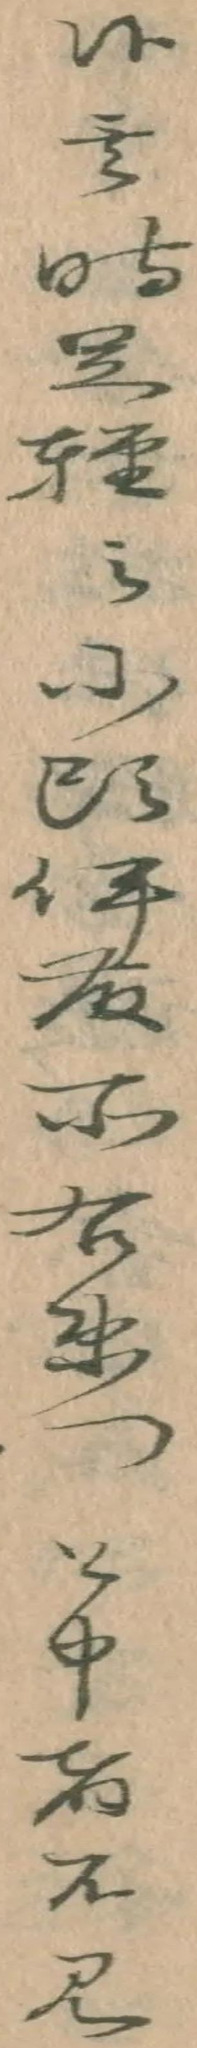候其時足軽之小頭伊藤所右衛門と申者不見
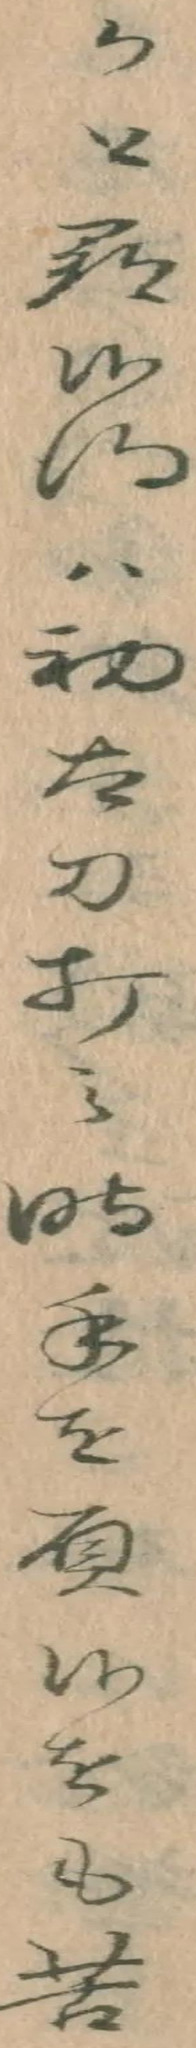かと尋候得は初太刀打之時手を負候をも苦
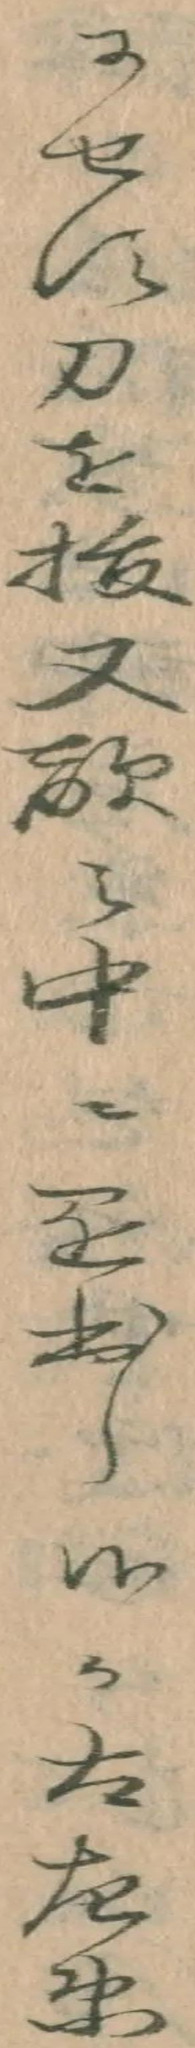ませ須刀を抜又敵之中に懸出し候か太左衛
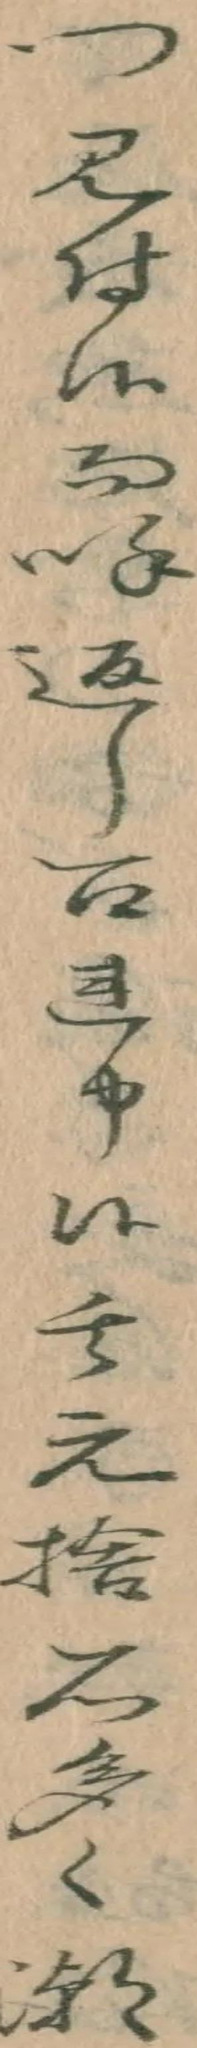門見付候而呼返し召連申候其元捨石多く潮
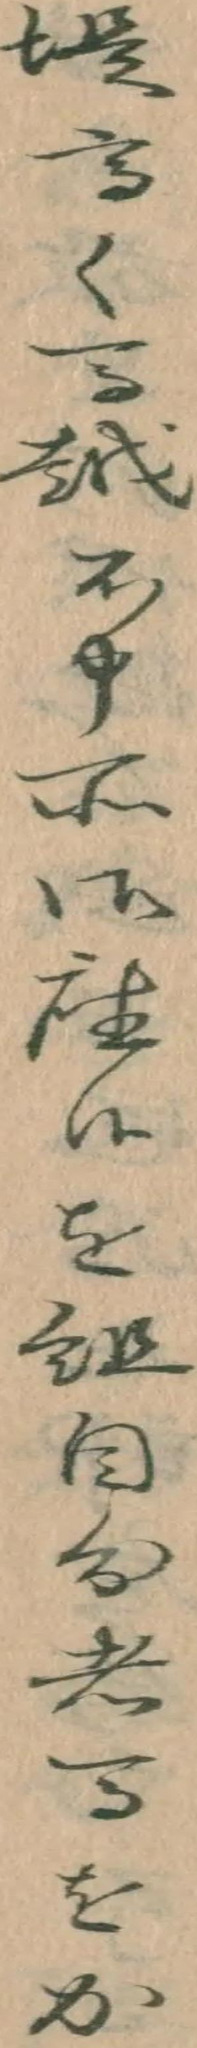堤高く馬越不申所御座候を組自分者馬をか
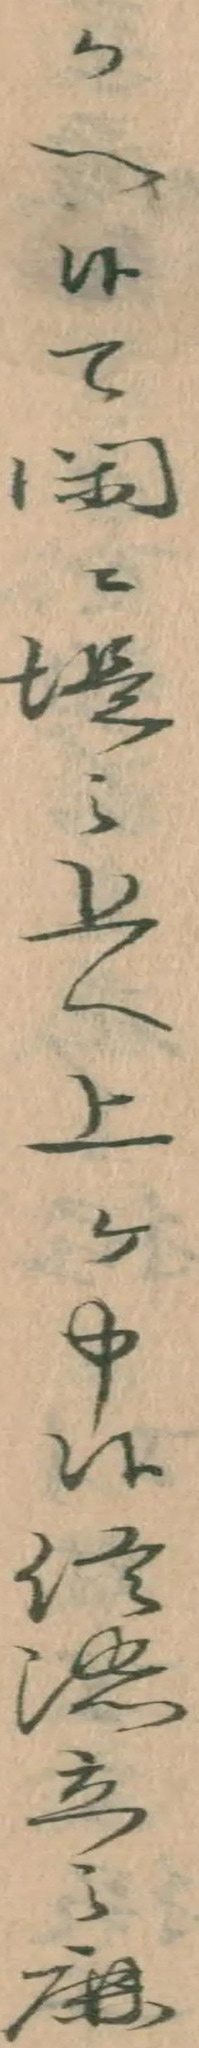かへ候て閑に堤之上へ上け申候信濃立之鹿
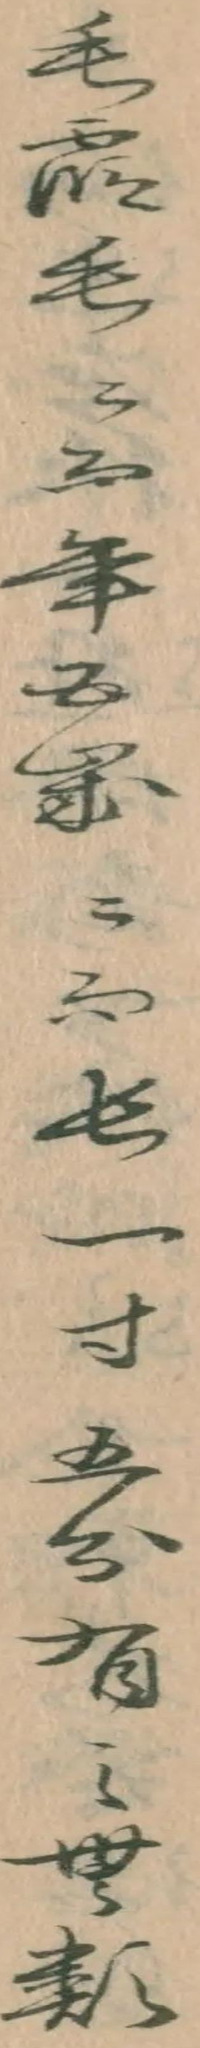毛霞毛に而年五歳に而長一寸五分有之無類
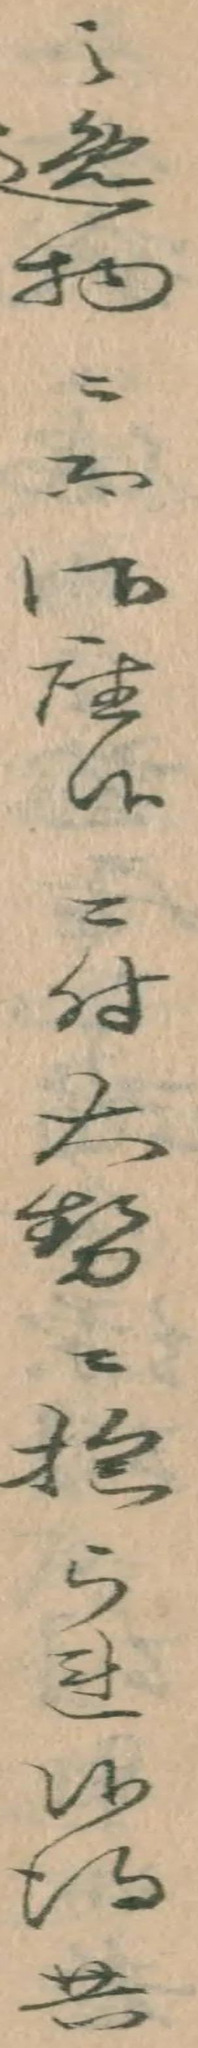之逸物に而御座候に付大勢に抱ら連候得共
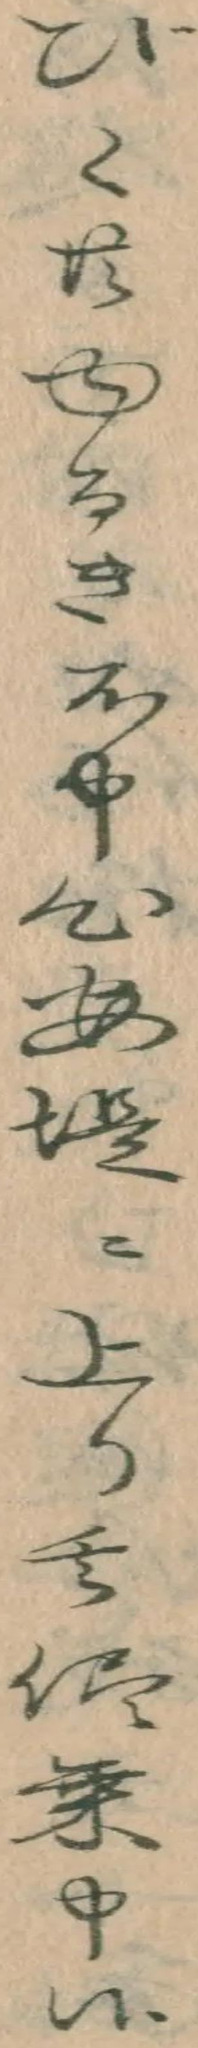ひく共ゆるき不申心安堤に上り其侭乗申候
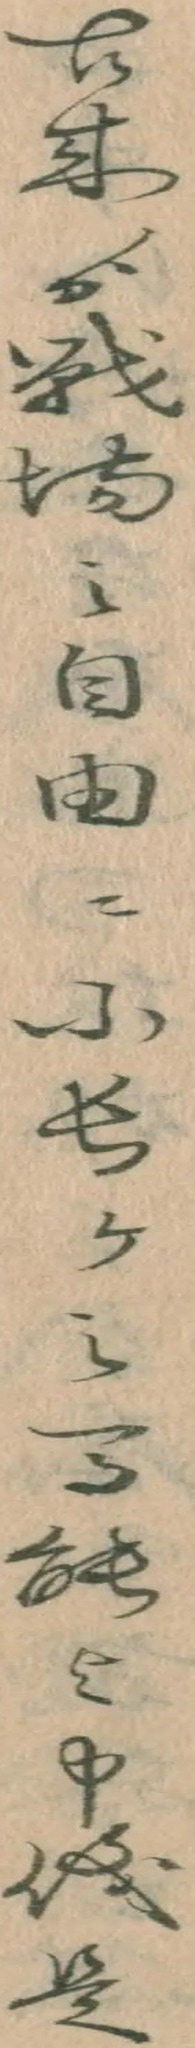古来ゟ戦場之自由に小長け之馬能与申儀是
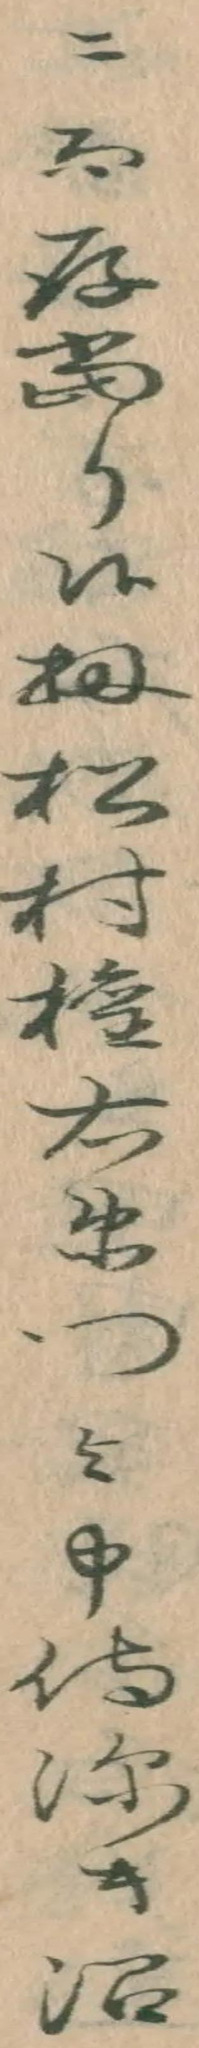に而存当り候扨松村権右衛門与申侍深き沼
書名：切支丹御退治記 49巻. [2]
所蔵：国立国会図書館 National Diet Library, JAPAN
